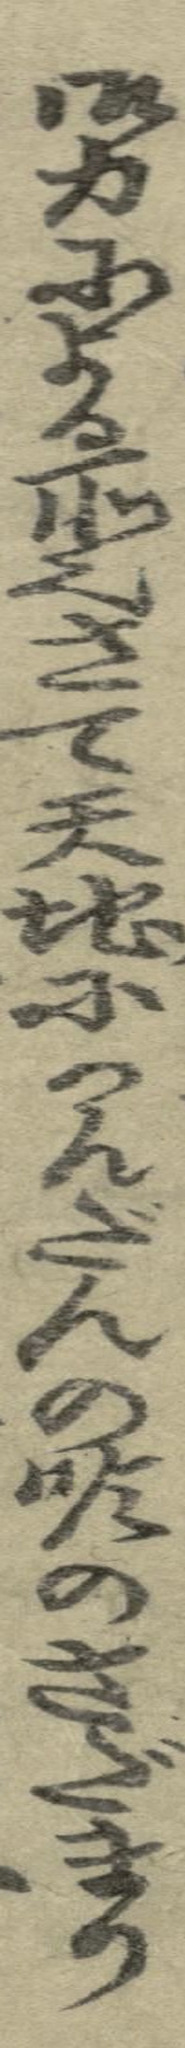御力による所也さて天地にかんだんの順のさだまり
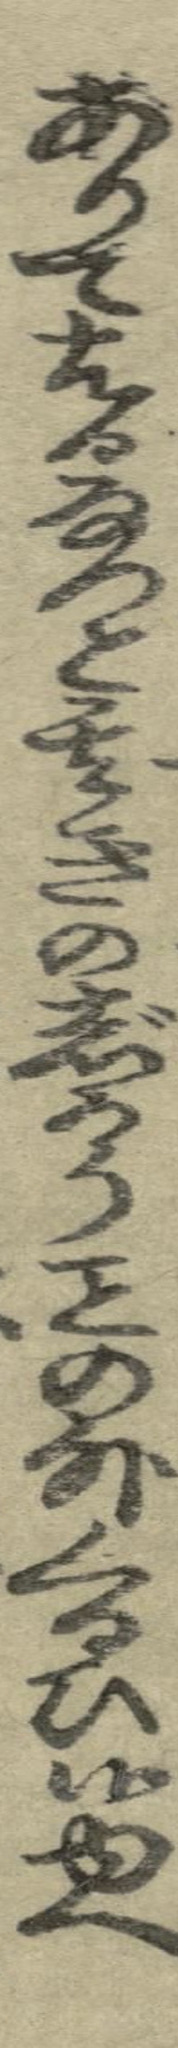ありてはるなつと其きのじかうことの外くるひ候ゆへ
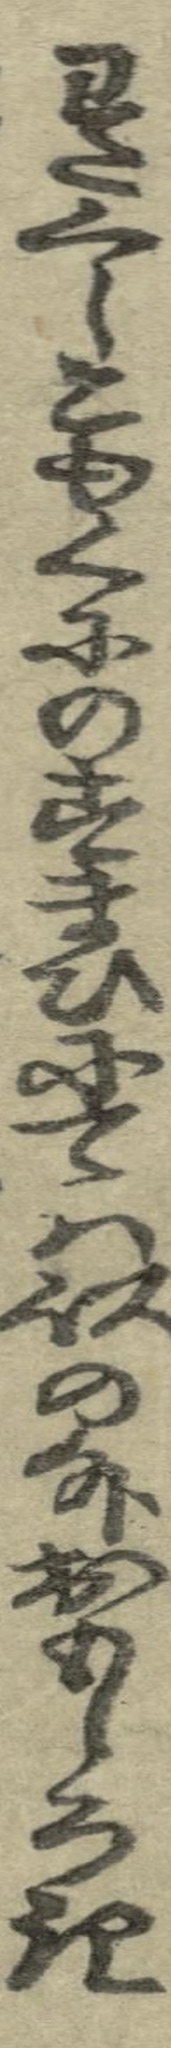わたくしともくにのすまひにては以の外おもしろき
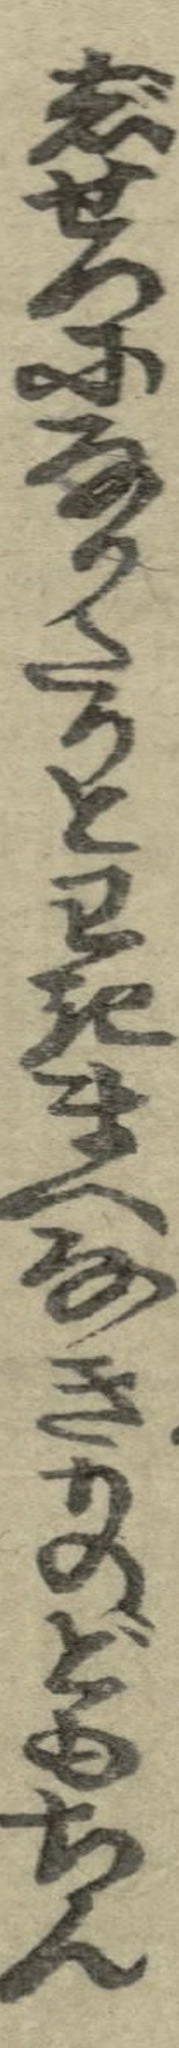じせつになりたりとわきまへなきものどもちん
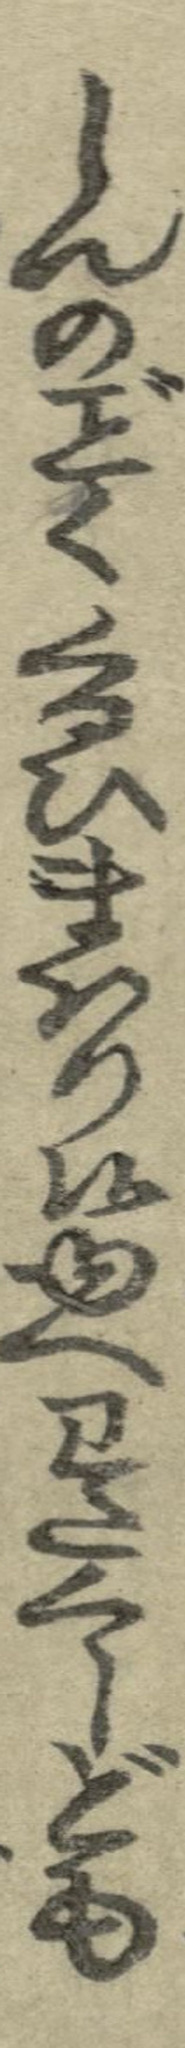しんのごとくくるひまはり候ゆへわたくしども
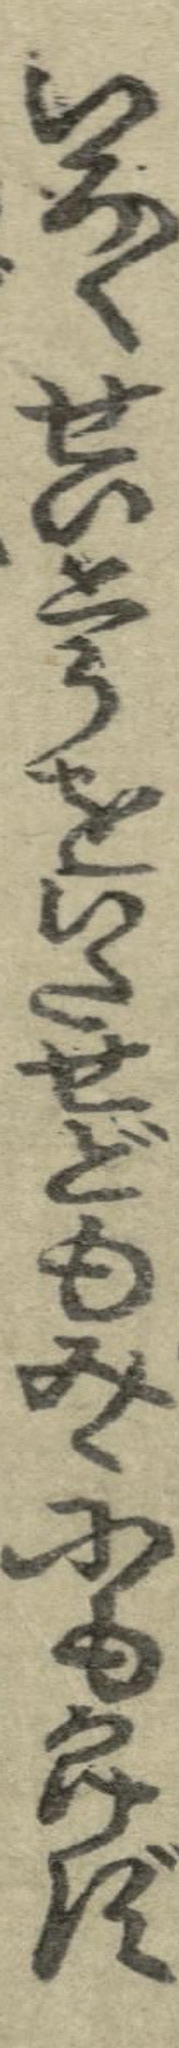いろ〳〵せいとうをいたせどもみゝにもかけず
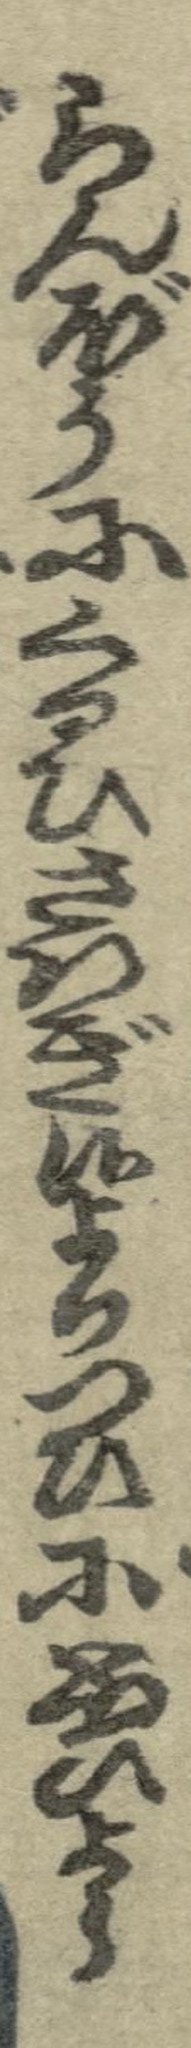らんぼうにくるひさはぎ候よりつひに思ひよら
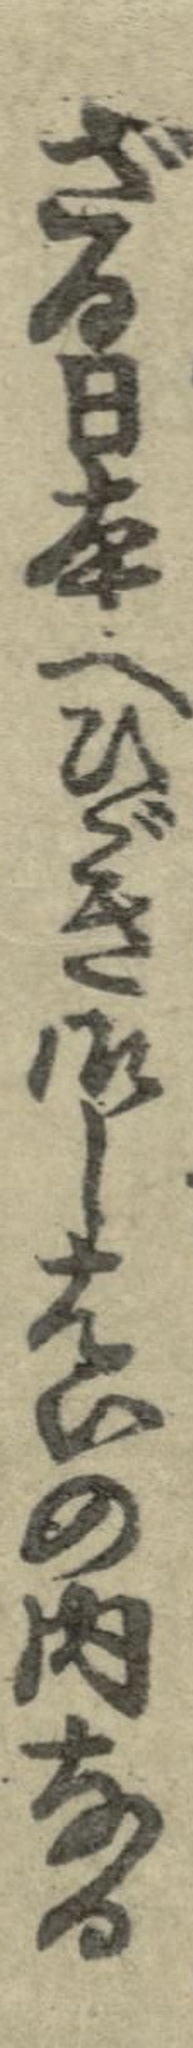ざる日本へひゞき御しはいの内なる
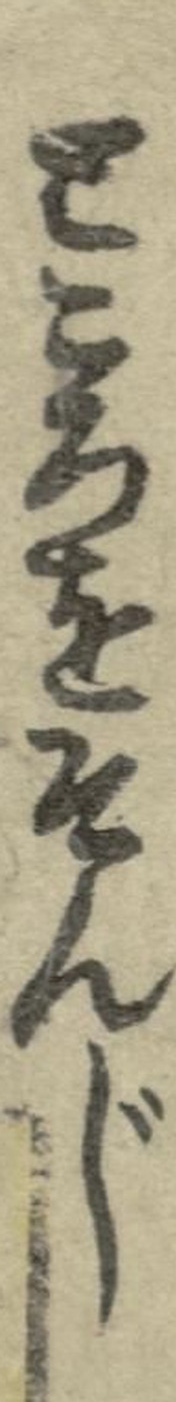ところをそんじ
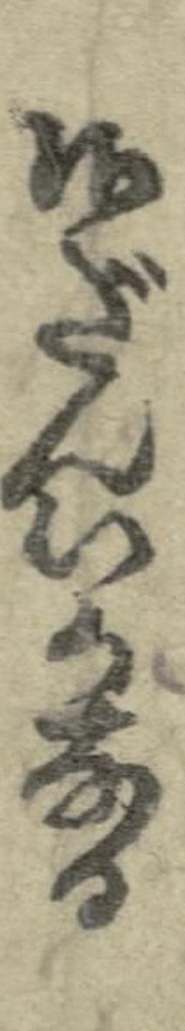候だんいかなる
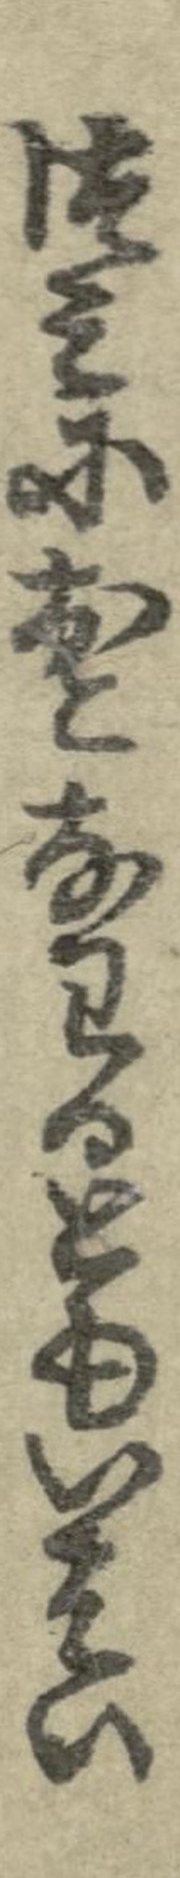つみにおとなわるともいはい
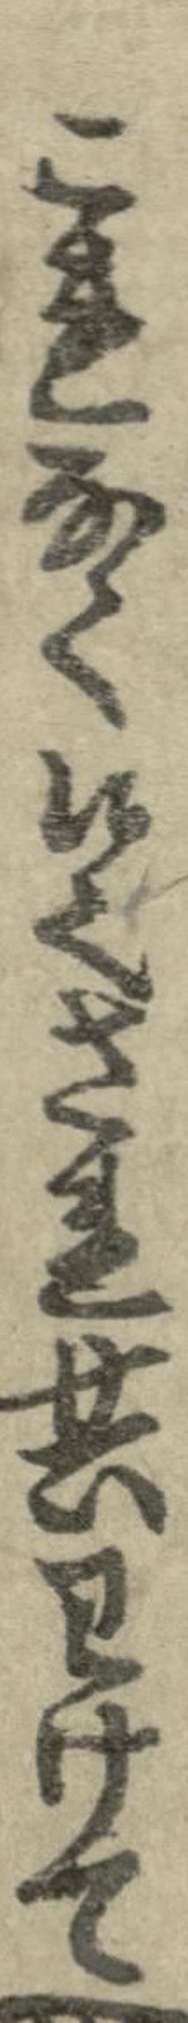これなく候也され共わけて
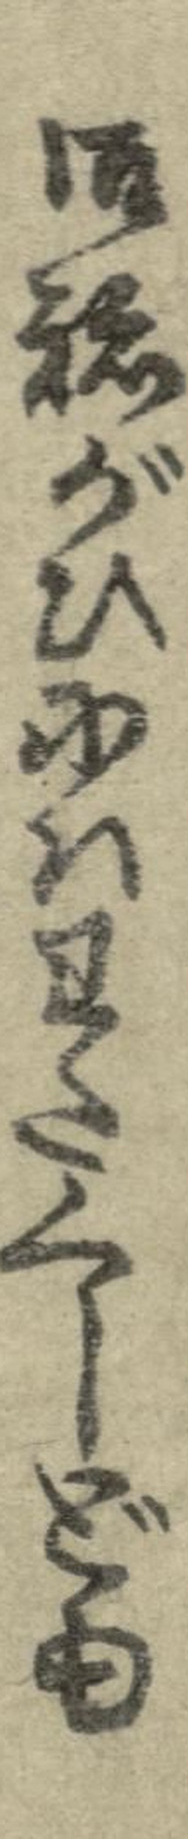御ねがひにはわたくしども
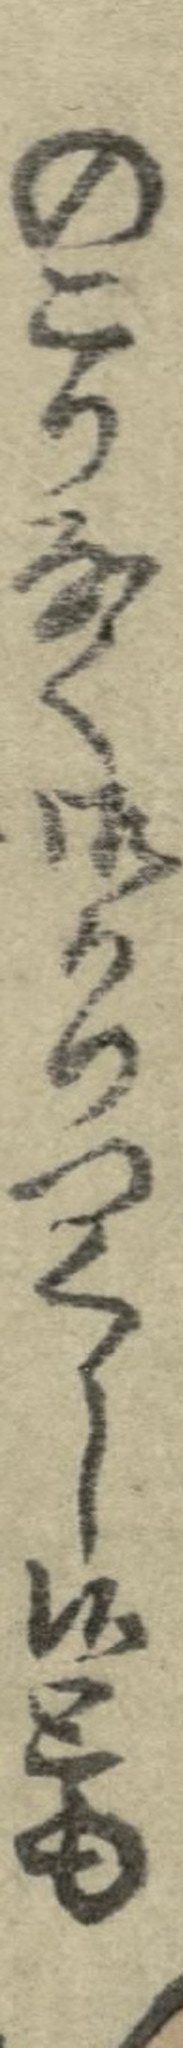のこりなく御かりつくし候とも
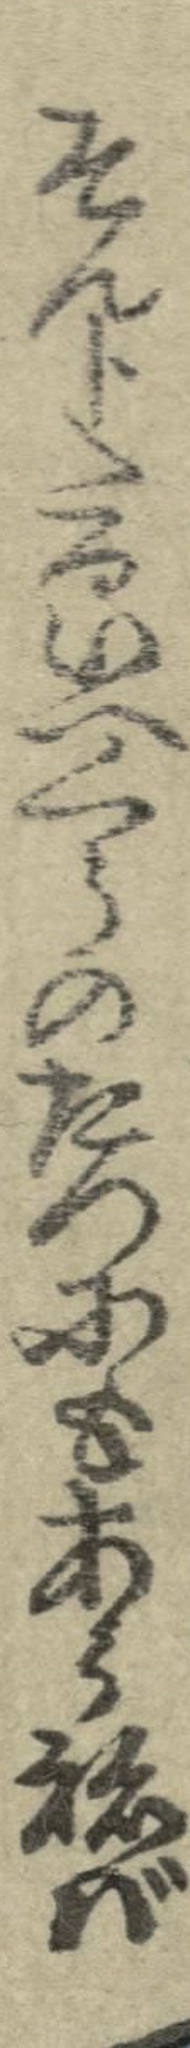そんじたるいへくらのたつにもあらねば
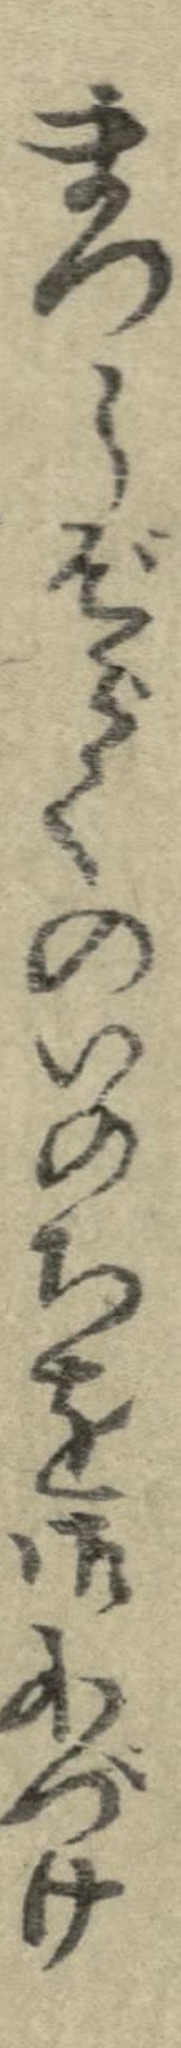まつしばらくのいのりを御あづけ
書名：恵比壽天申譯之記
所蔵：東京大学地震研究所図書室 Earthquake Research Institute Library, The University of Tokyo, JAPAN
